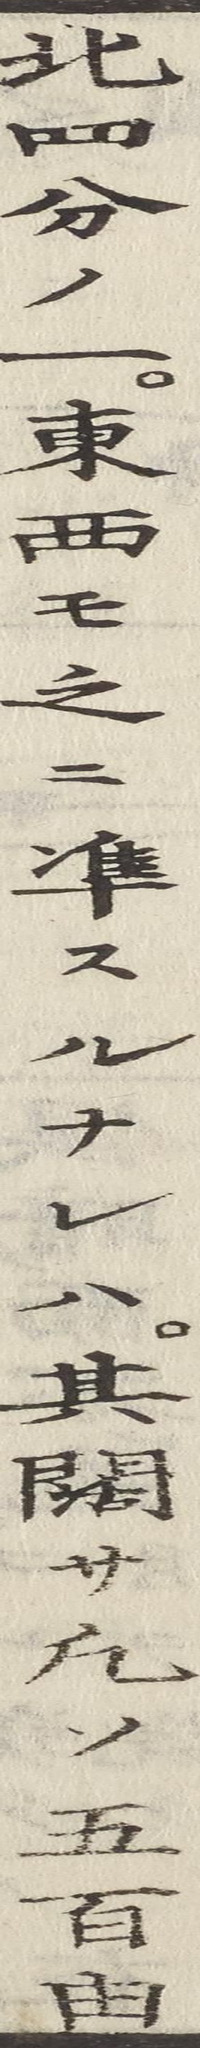北四分ノ一。東西モ之ニ準スルナレハ。其闊サ凡ソ五百由
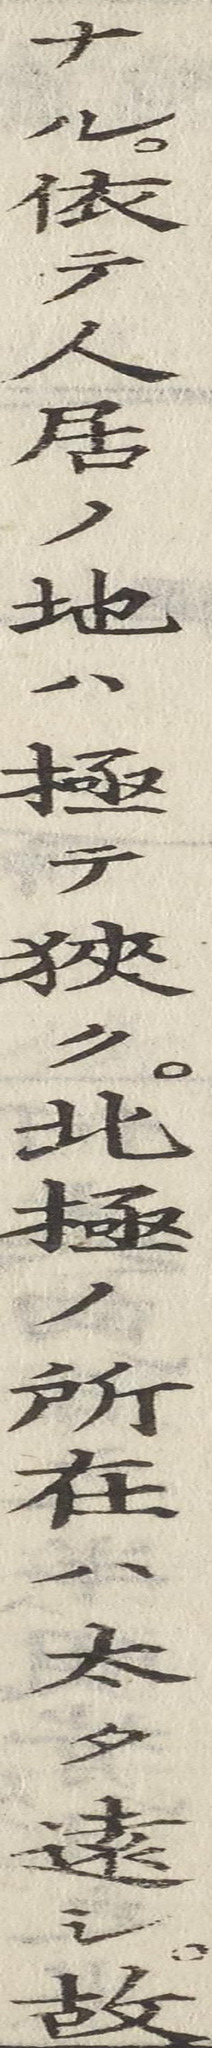ナル。依テ人居ノ地ハ極テ狭ク。北極ノ所在ハ太タ遠シ。故
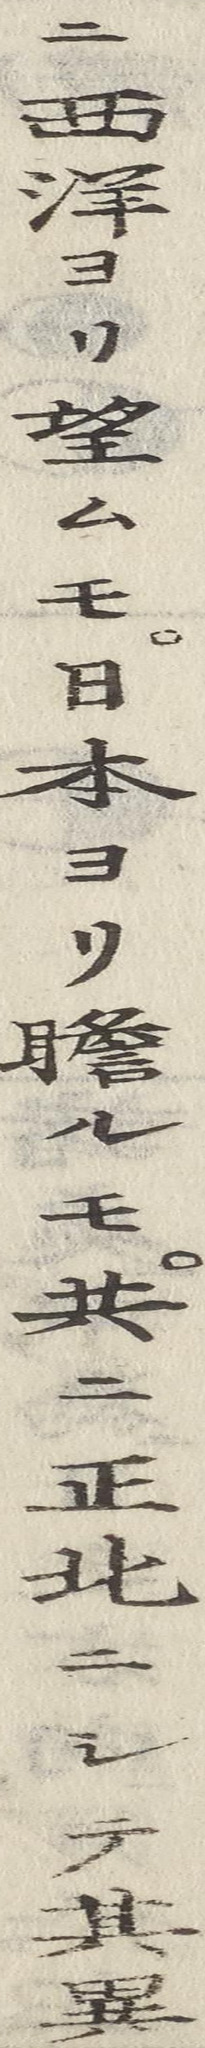ニ西洋ヨリ望ムモ。日本ヨリ瞻ルモ。共ニ正北ニシテ其異

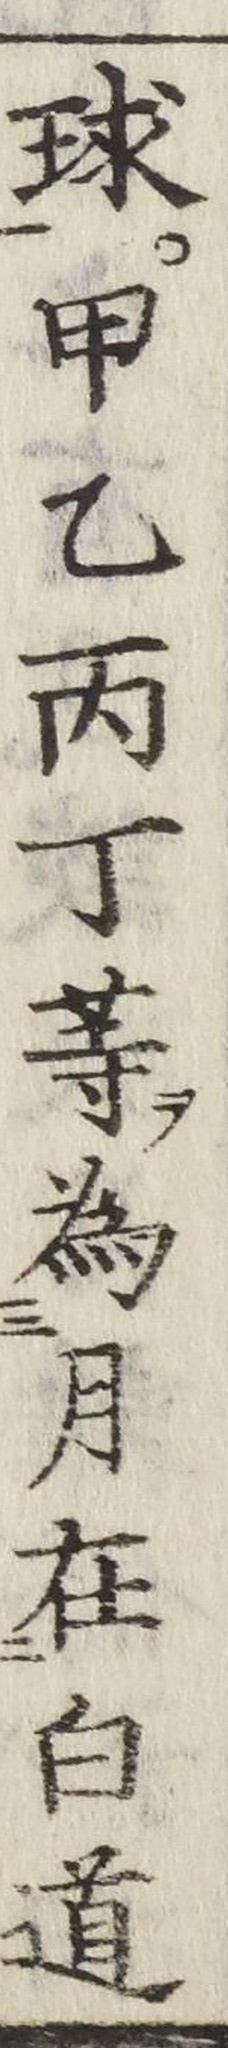球。甲乙丙丁等為月在ニ白道
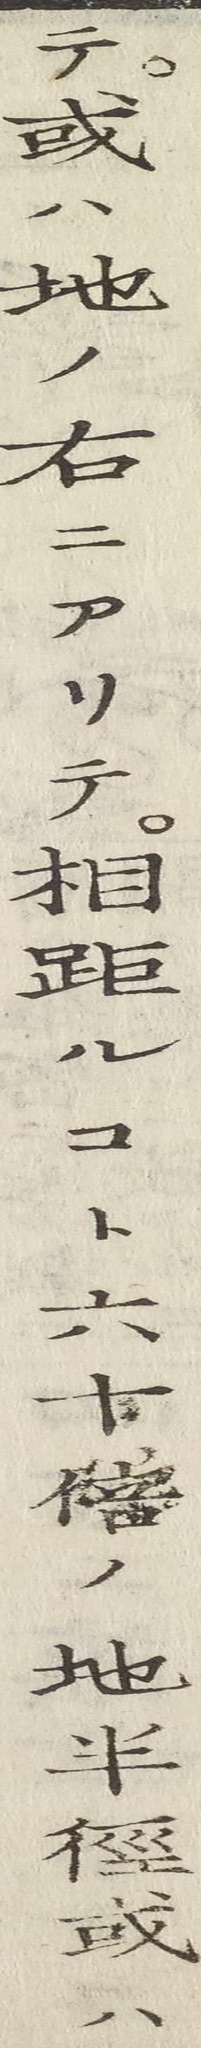テ。或ハ地ノ右ニアリテ。相距ルコト六十倍ノ地半径。或ハ
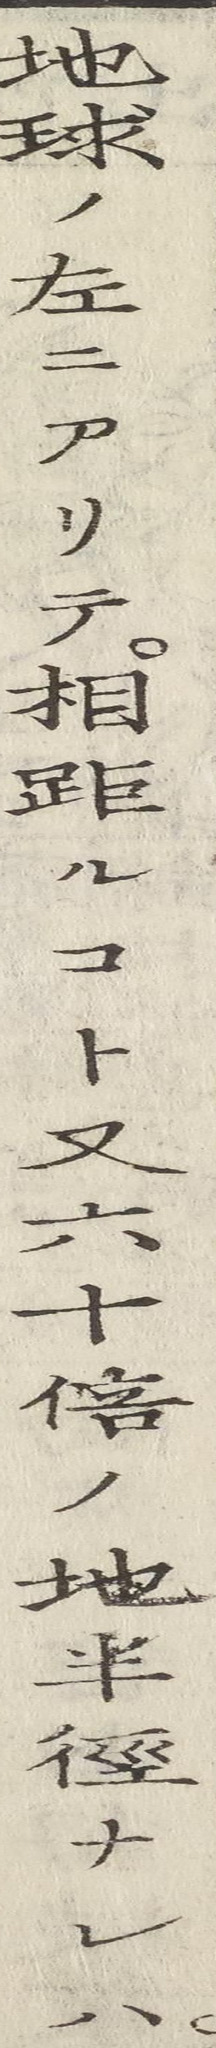地球ノ左ニアリテ。相距ルコト又六十倍ノ地半径ナレハ。
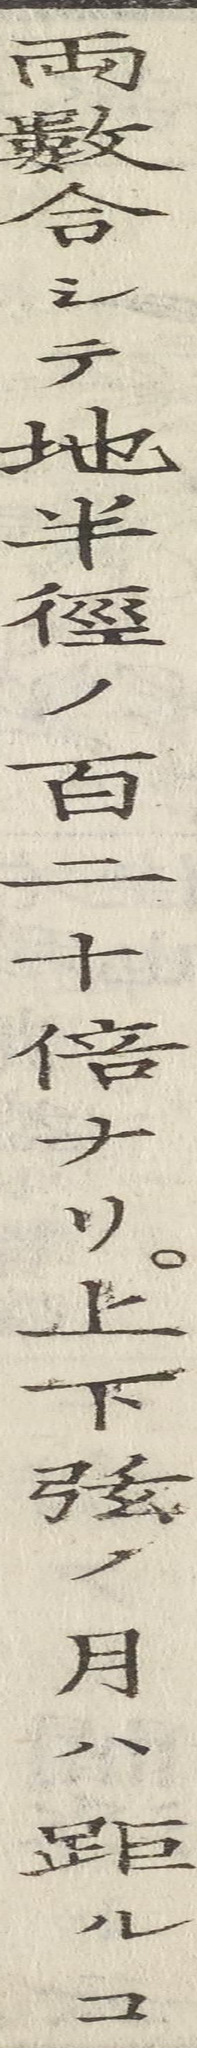両数合シテ地半径ノ百二十倍ナリ。上下弦ノ月ハ距ルコ
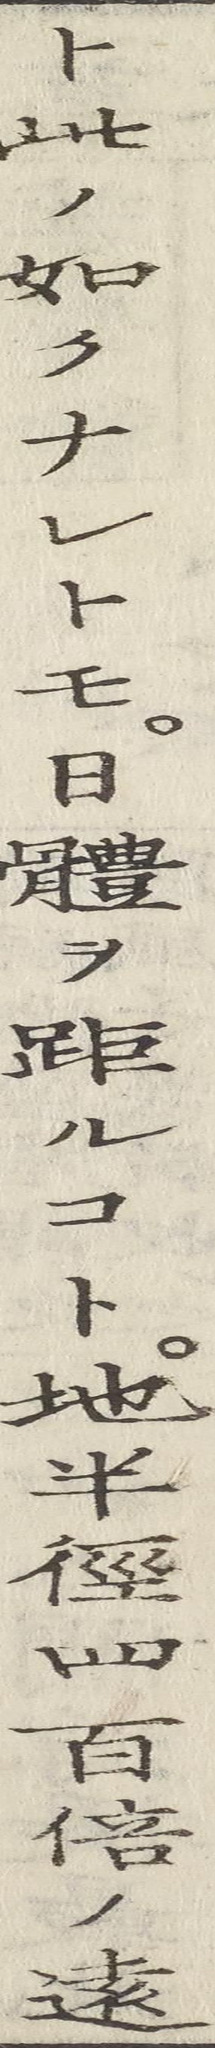ト此ノ如クナレトモ。日体ヲ距ルコト。地半径四百倍ノ遠
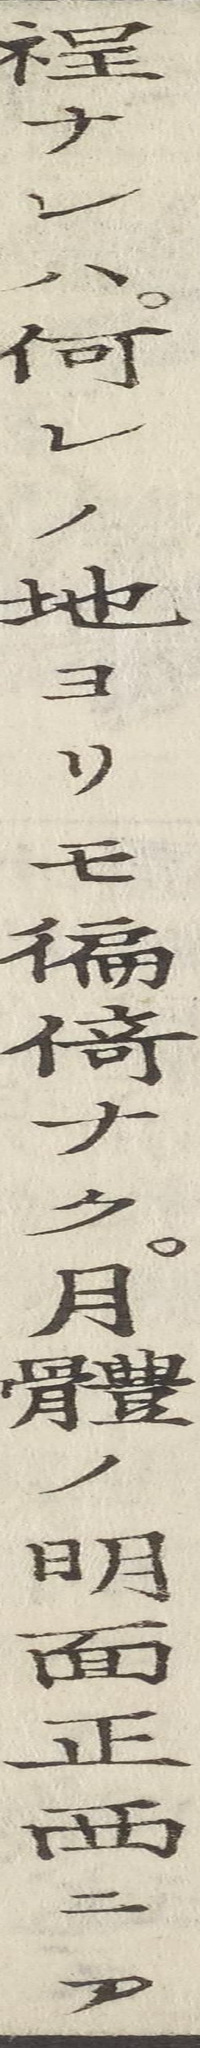程ナレハ。何レノ地ヨリモ徧倚ナク。月体ノ明面正西ニア
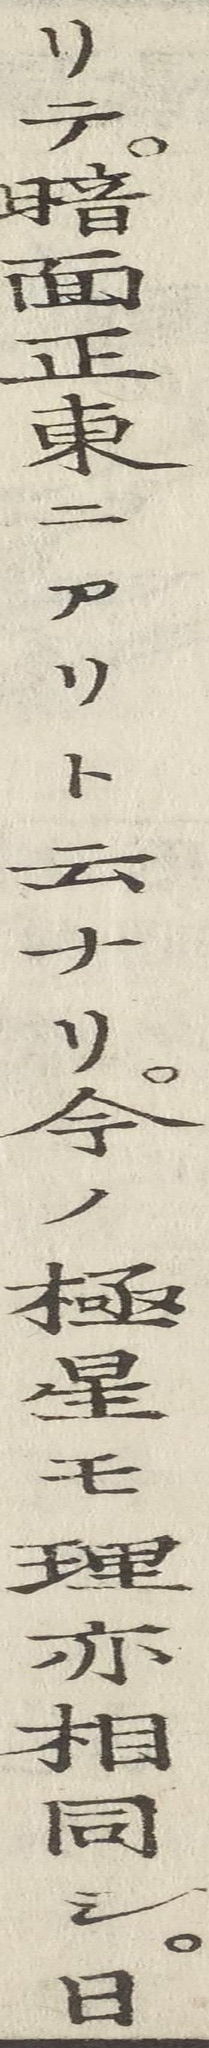リテ。暗面正東ニアリト云ナリ。今ノ極星モ理亦相同シ。日
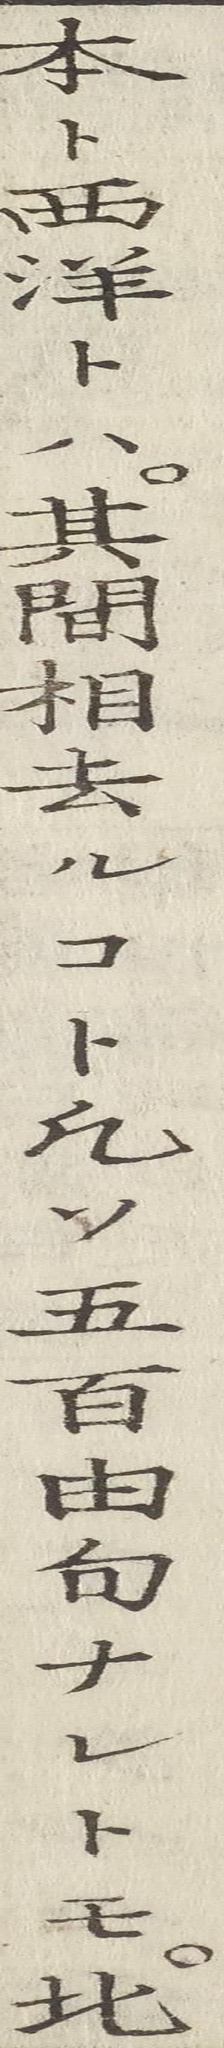本ト西洋トハ。其間相去ルコト凡ソ五百由旬ナレトモ。北
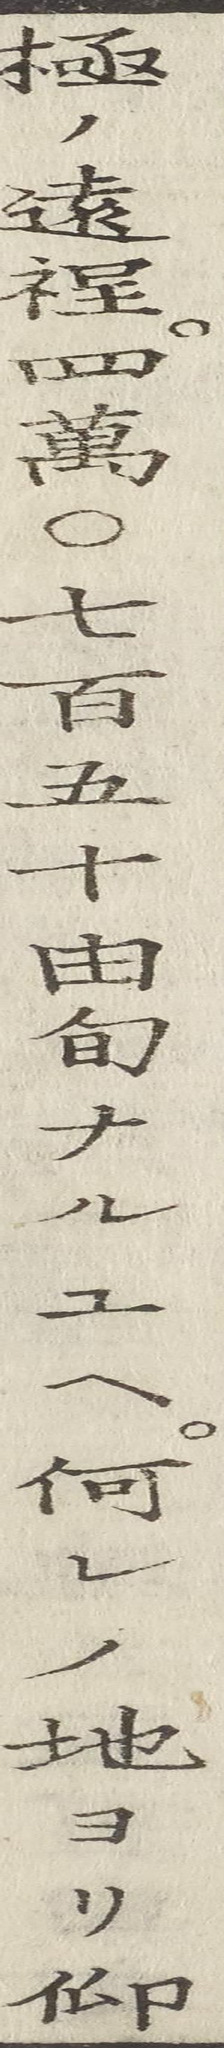極ノ遠程。四万〇七百五十由旬ナルユヘ。何レノ地ヨリ仰
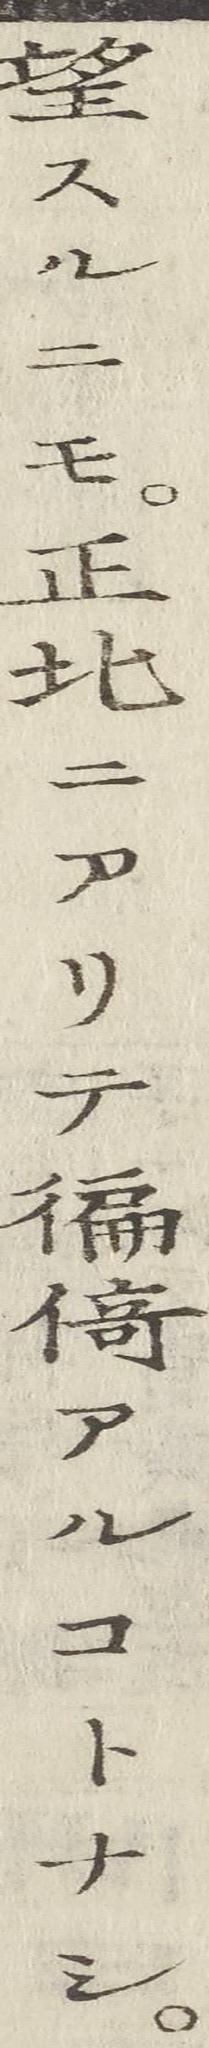望スルニモ。正北ニアリテ徧倚アルコトナシ。

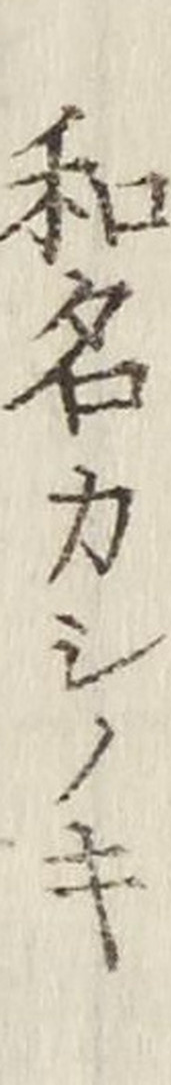和名カシノキ
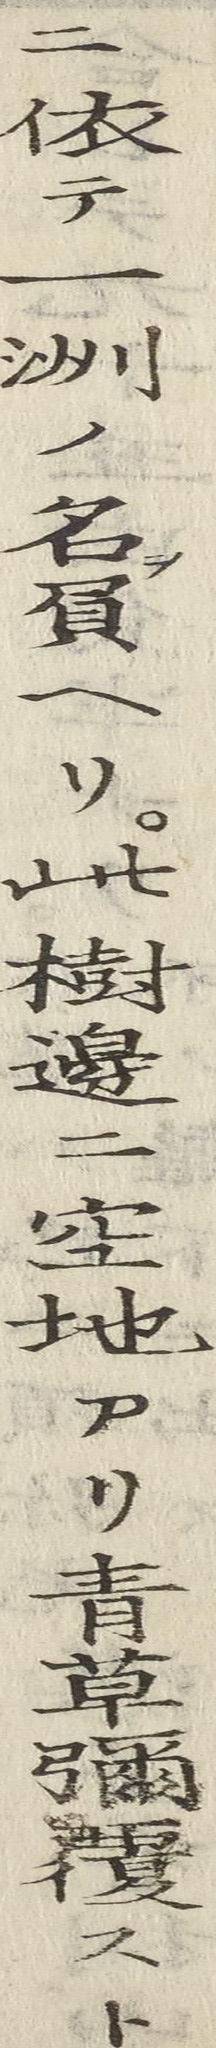ニ依テ一洲ノ名負ヘリ。此樹辺ニ空地アリ青草弥覆スト
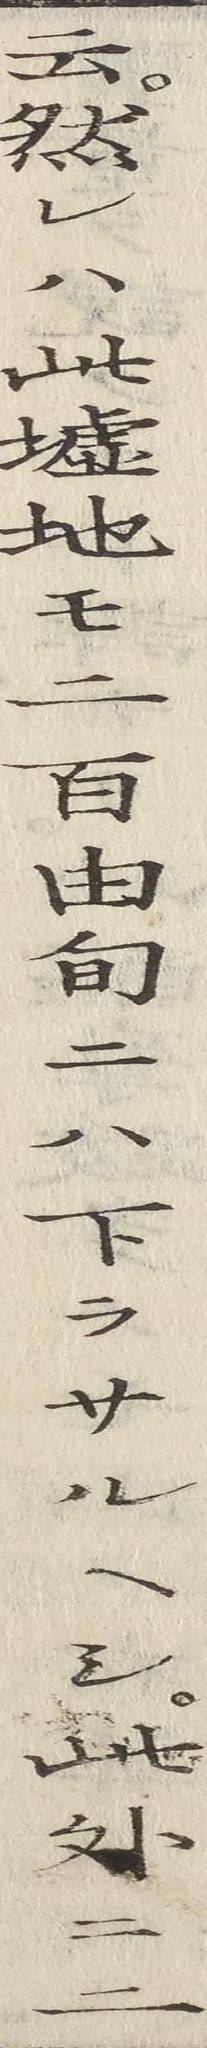云。然レハ此墟地モ二百由旬ニハ下ラサルヘシ。此外ニニ
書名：護法新論　二編　中
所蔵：東京大学地震研究所図書室 Earthquake Research Institute Library, The University of Tokyo, JAPAN
